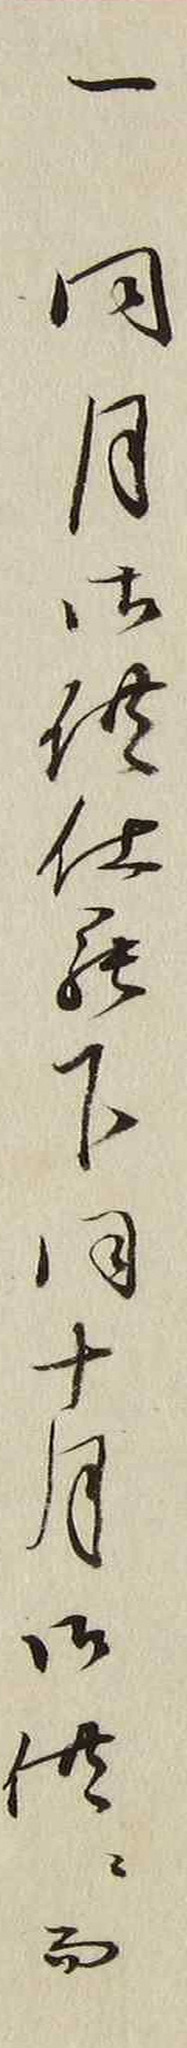一同月御供仕罷下同十月御供ニ而
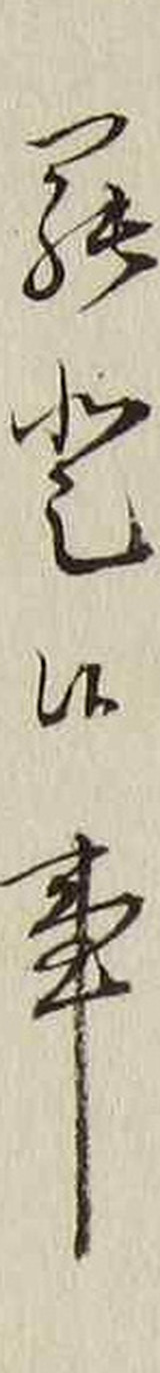罷登候事
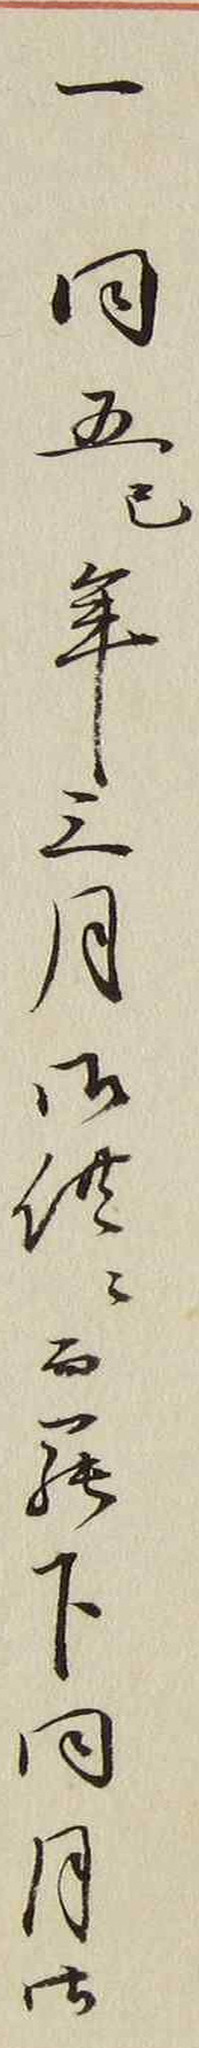一同五巳年三月御供ニ而罷下同月御
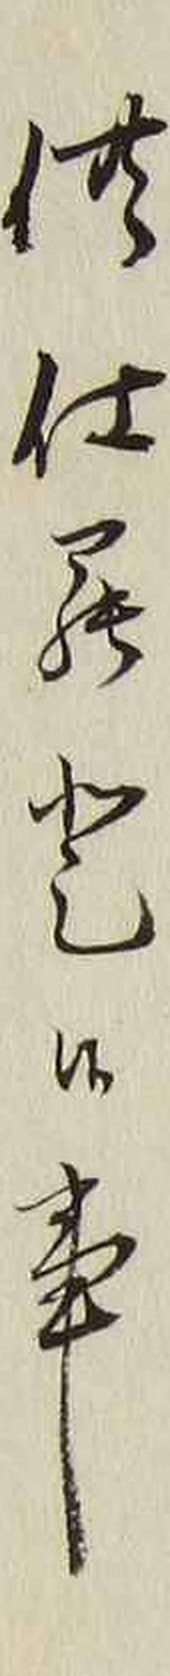供仕罷登候事
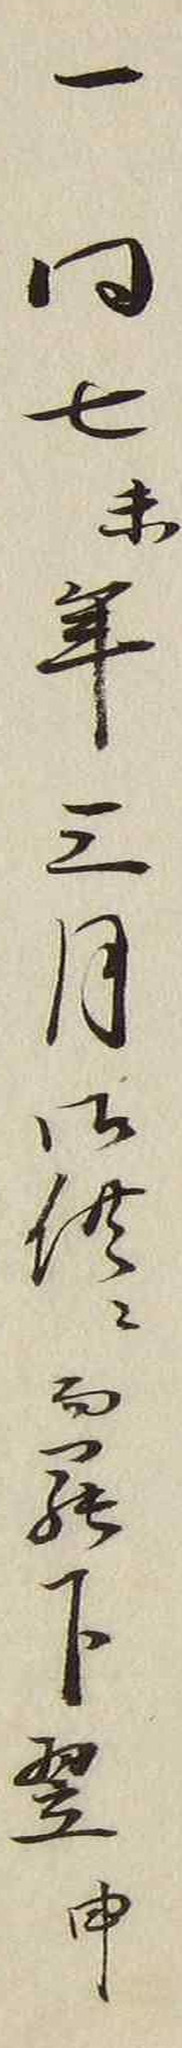一同七未年三月御供ニ而罷下翌申

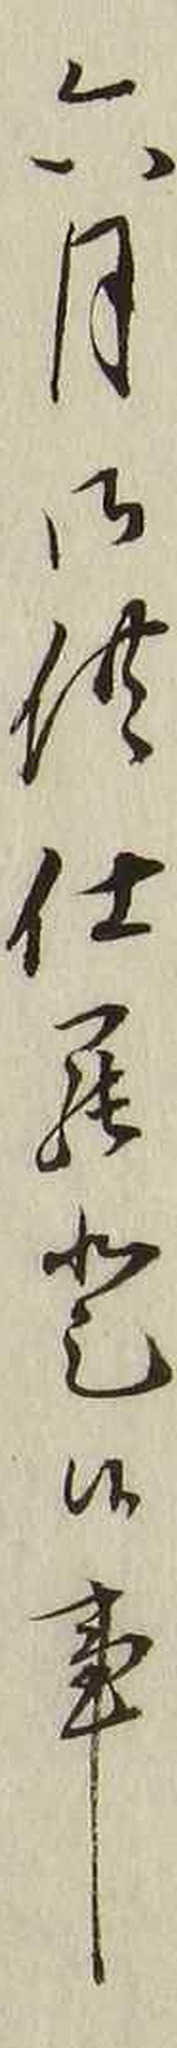六月御供仕罷登候事
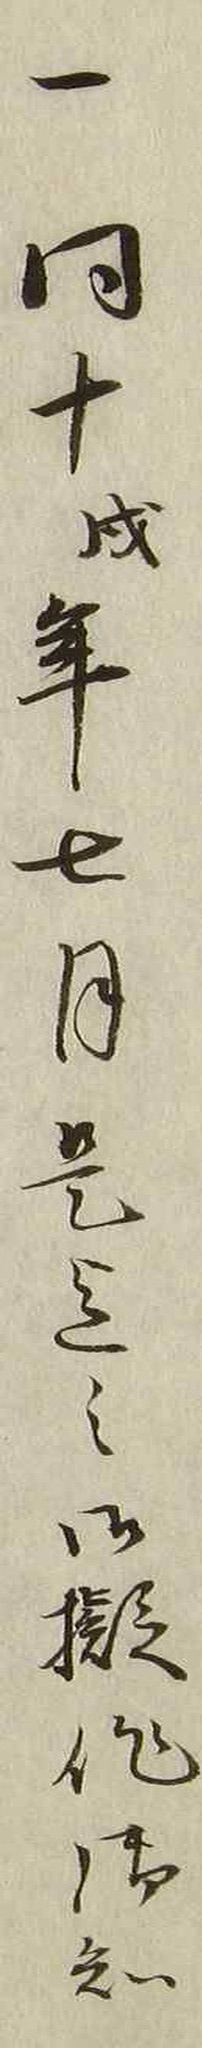一同十戌年七月是迄之御擬作御知
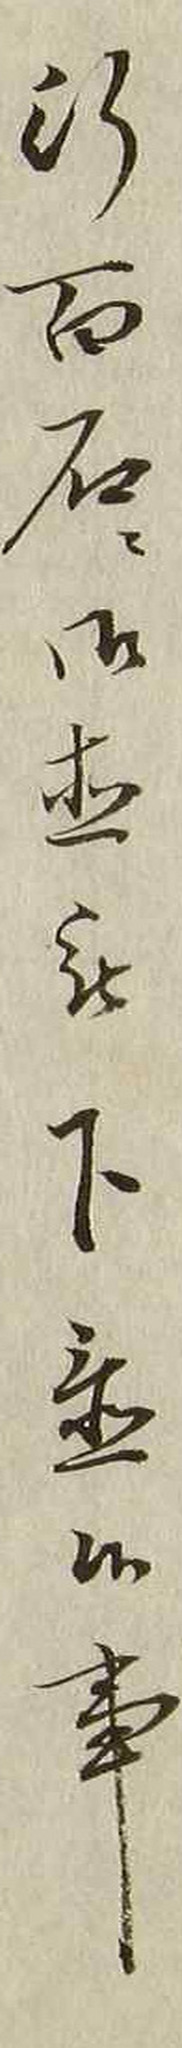行百石ニ御直被下置候事
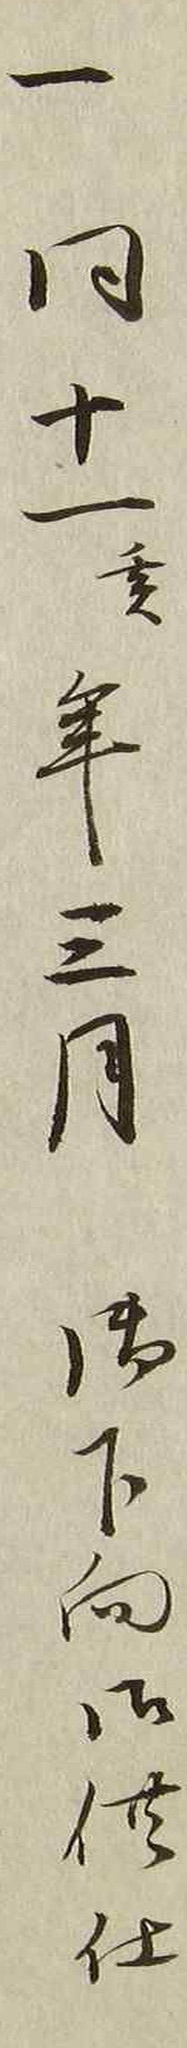一同十一亥年三月御下向御供仕
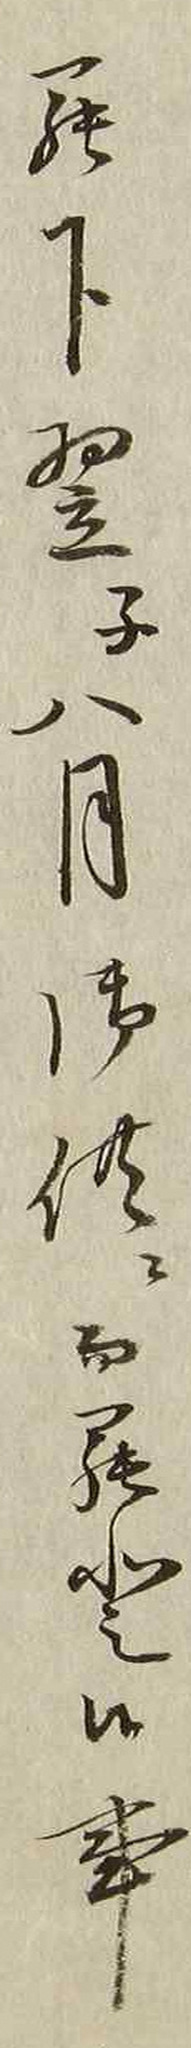罷下翌子八月御供ニ而罷登候事
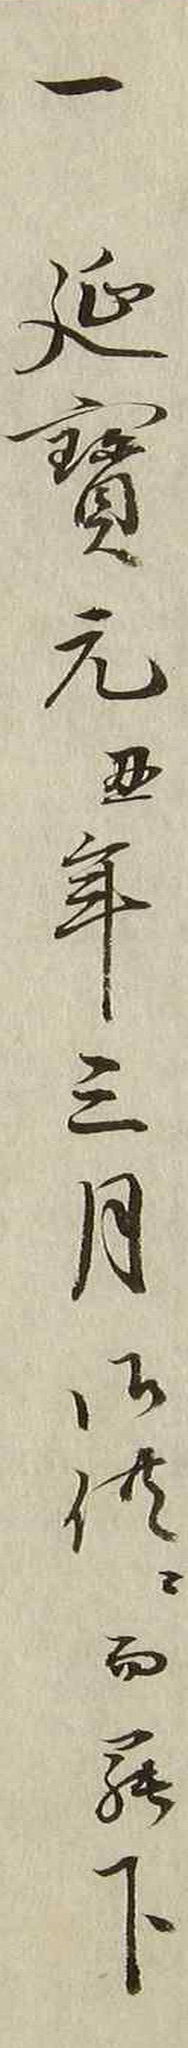一延宝元丑年三月御供ニ而罷下
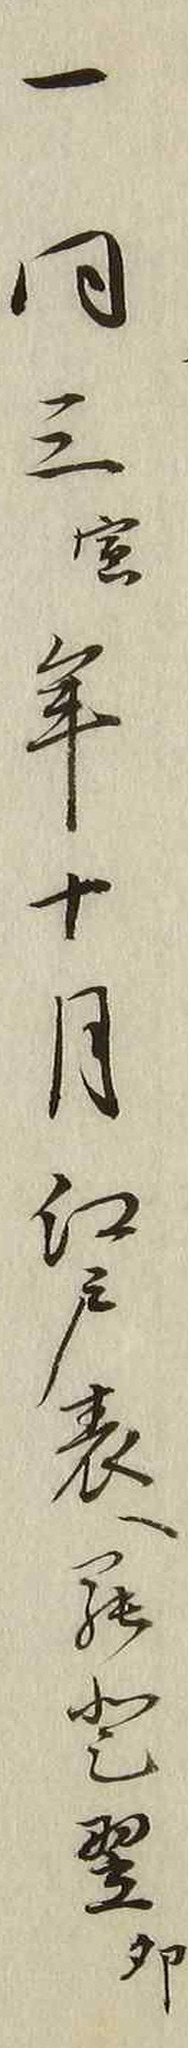一同三寅年十月紅戸表へ罷登翌卯
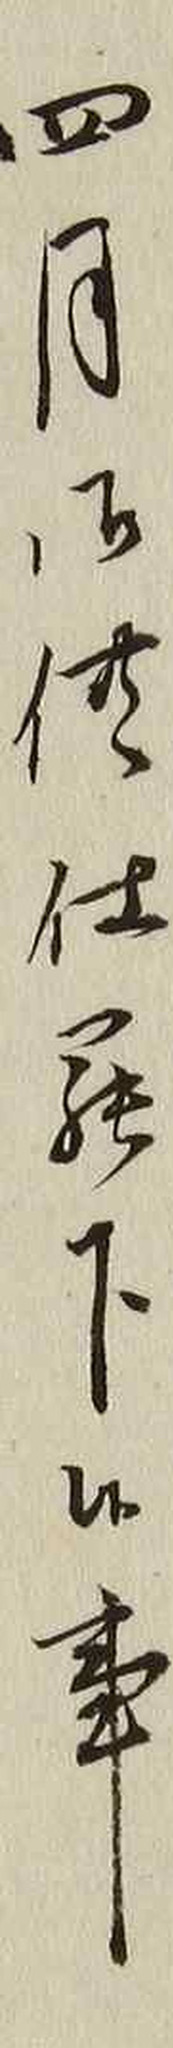四月御供仕罷下候事
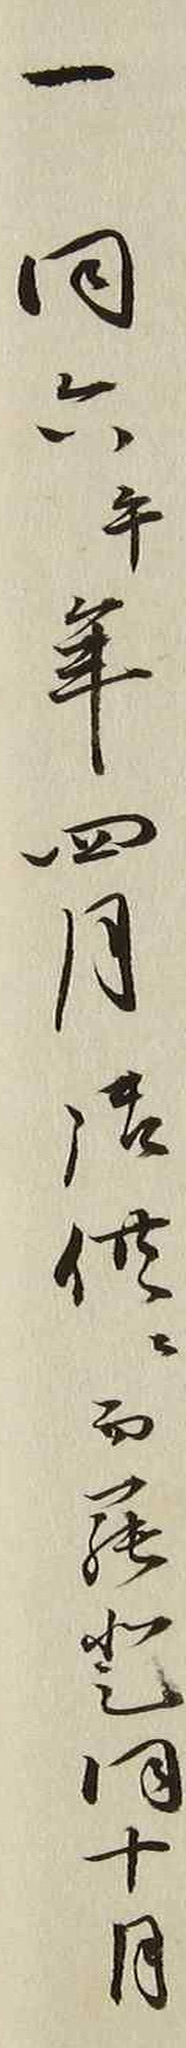一同六午年四月御供ニ而罷登同十月
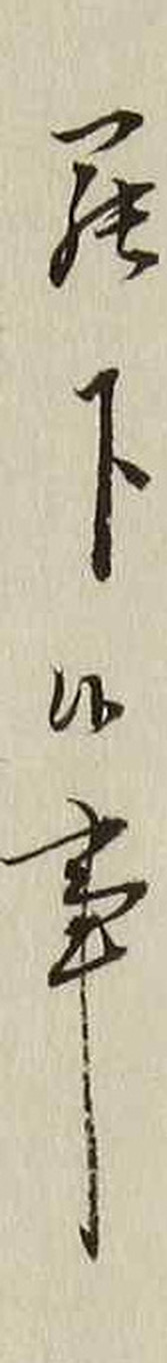罷下候事
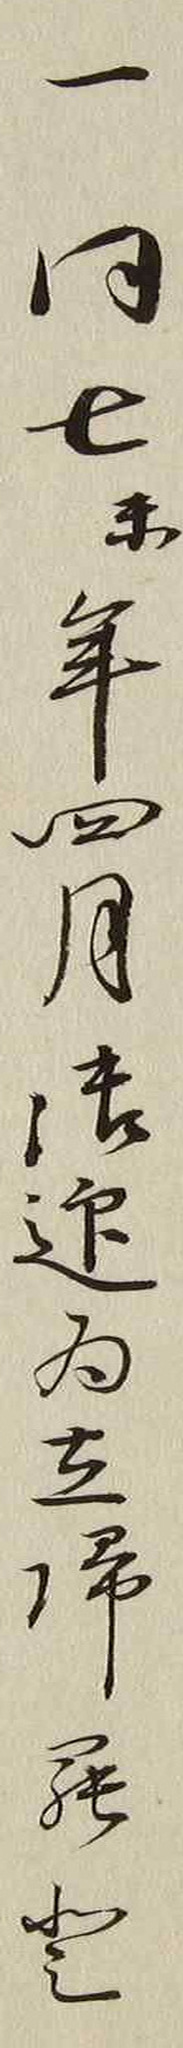一同七未年四月御迎為立帰罷登
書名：諸士系譜　巻之22　い之部22
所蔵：会津若松市立会津図書館
